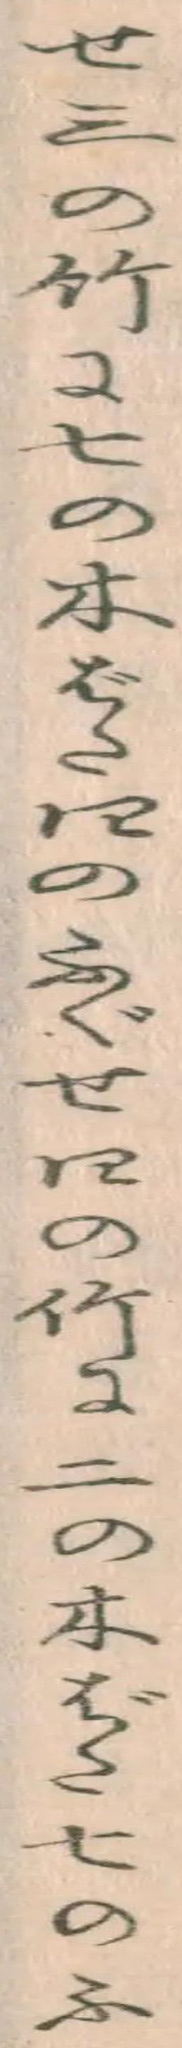せ三の竹に七の木ばた四のふぐせ四の竹に二の木ばた七のふ
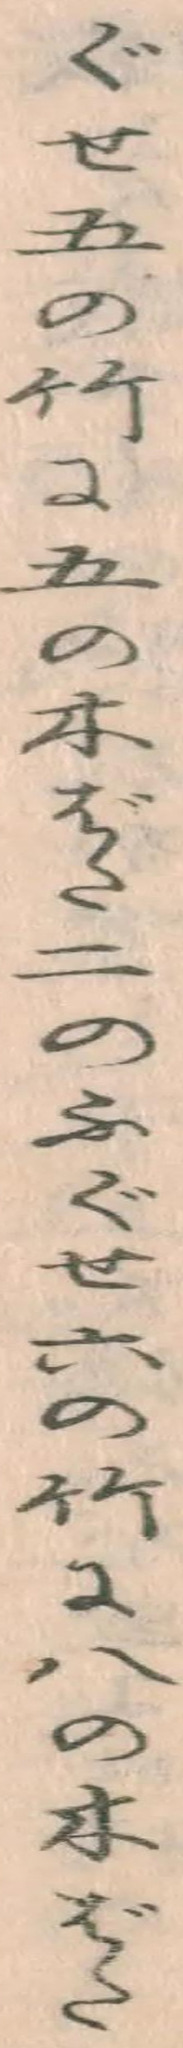ぐせ五の竹に五の木ばた二のふぐせ六の竹に八の木ばた
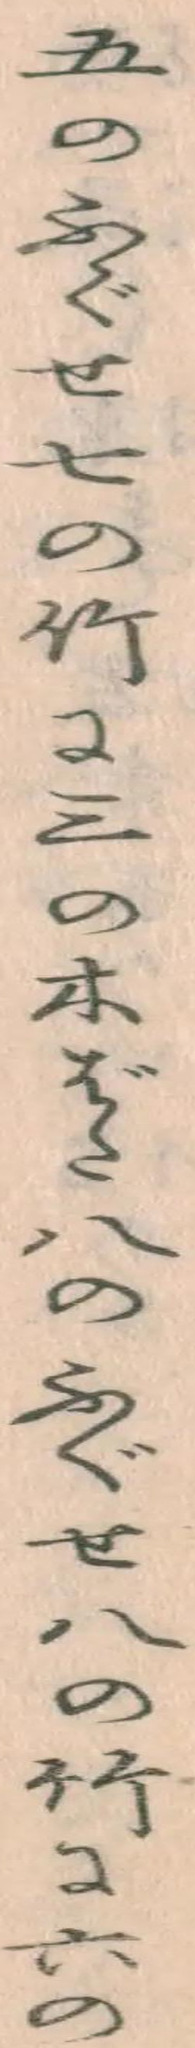五のふぐせ七の竹に三の木ばた八のふぐせ八の竹に六の
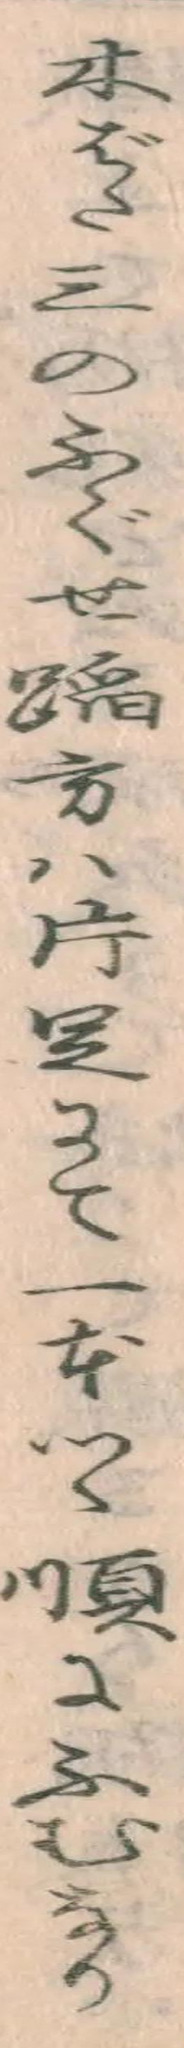木ばた三のふぐせ蹈方は片足にて一本つゝ順にふむなり
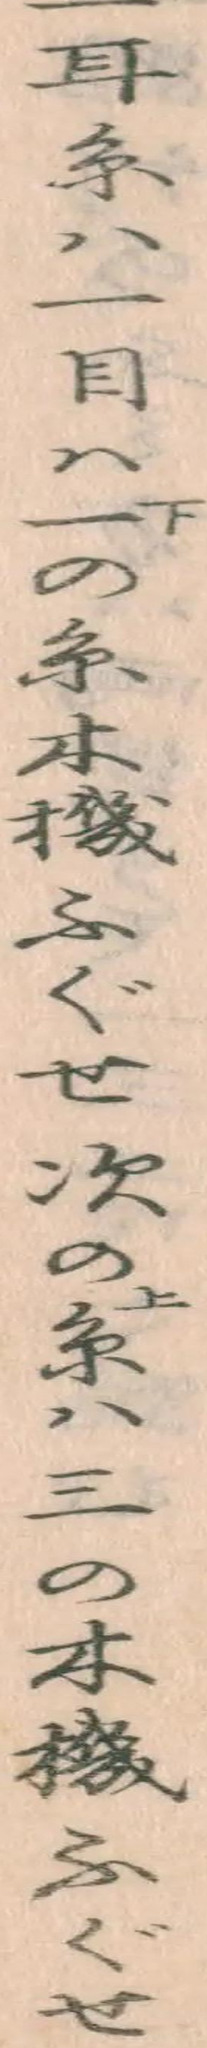一耳糸は一目は一の糸木機ふぐせ次の糸は三の木機ふぐせ
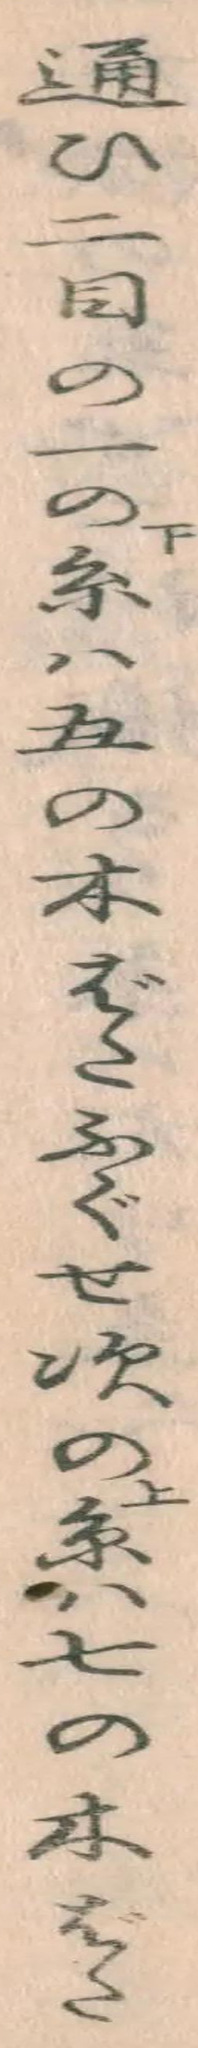通ひ二目の一の糸は五の木ばたふぐせ次の糸は七の木ばた
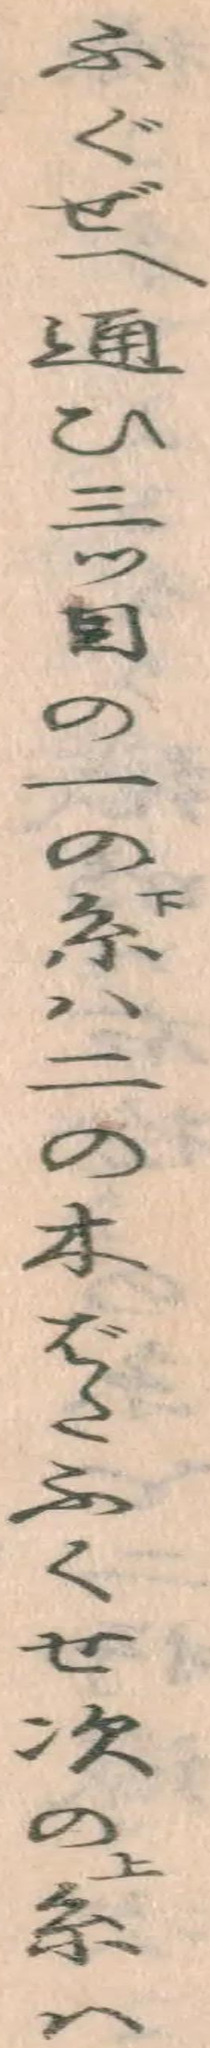ふぐぜへ通ひ三ッ目の一の糸は二の木ばたふくせ次の糸は
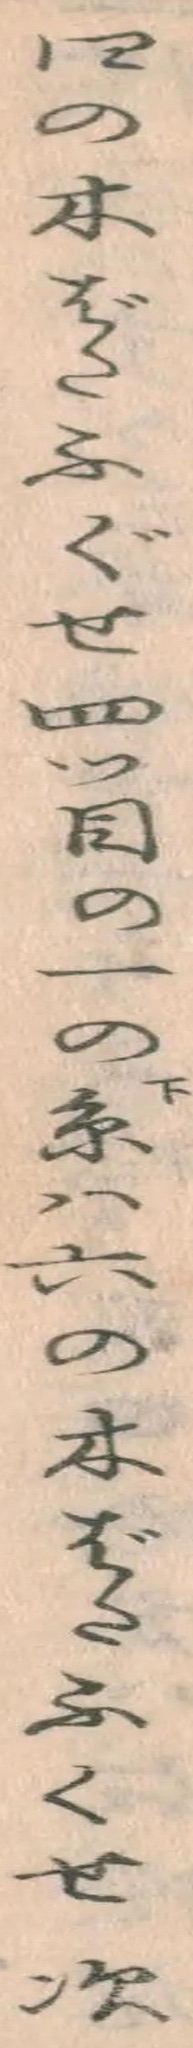四の木ばたふぐせ四ッ目の一の糸は六の木ばたふくせ次
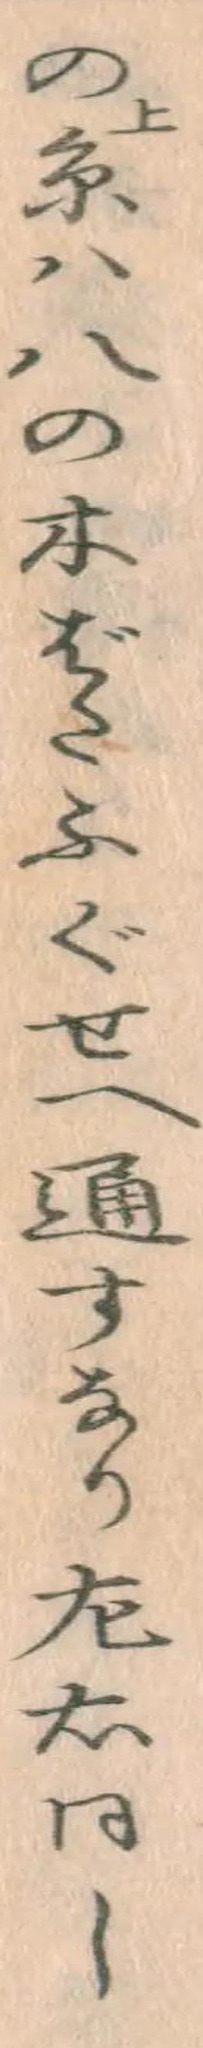の糸は八の木ばたふぐせへ通すなり左右同し
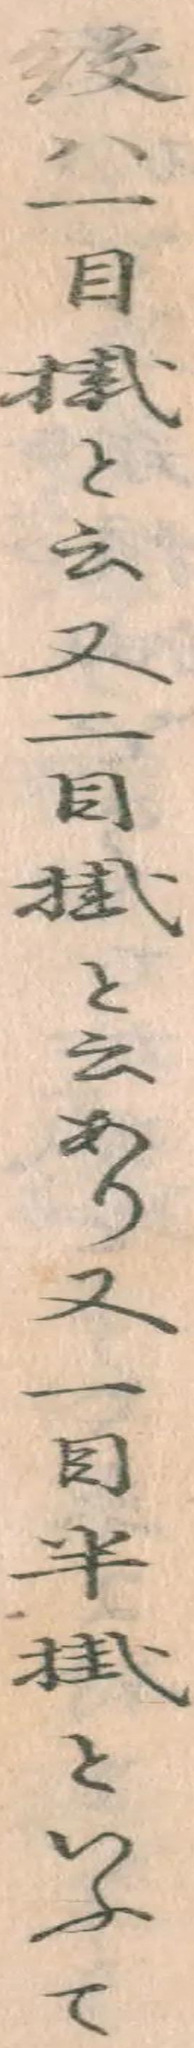一紋は一目掛と云又二目掛と云あり又一目半掛といふて
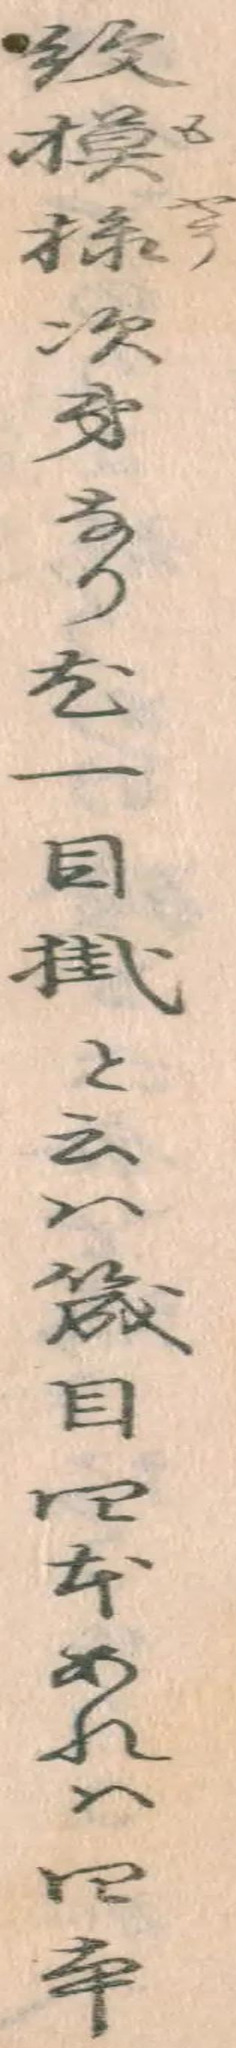紋模様次第なり尤一目掛と云は筬目四本あれは四本
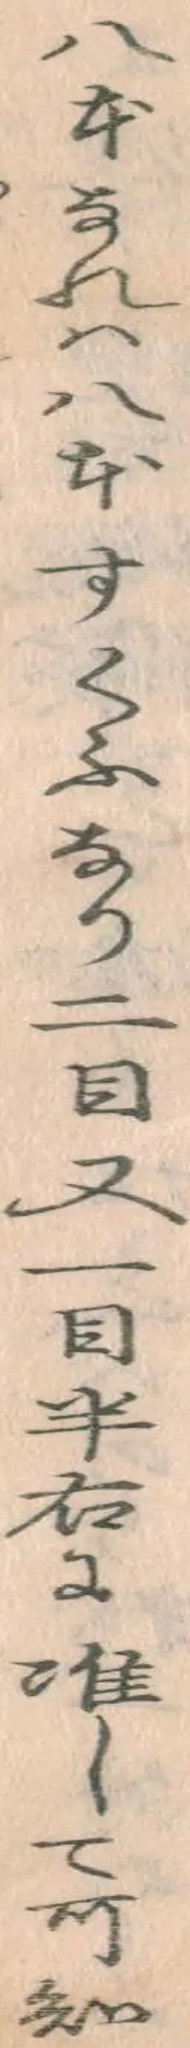八本なれは八本すくふなり二目又一目半右に准して可知
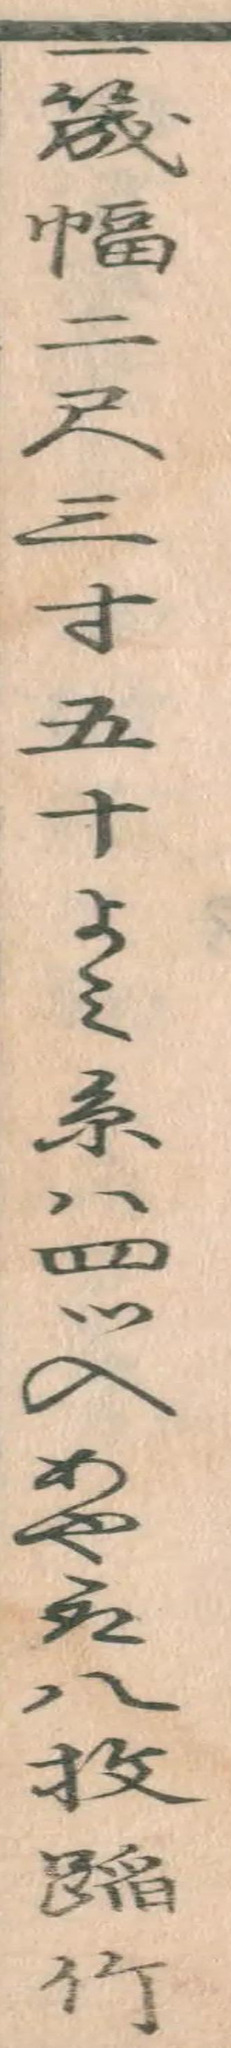一筬幅二尺三寸五十よみ糸は四ッ入あや取八枚蹈竹

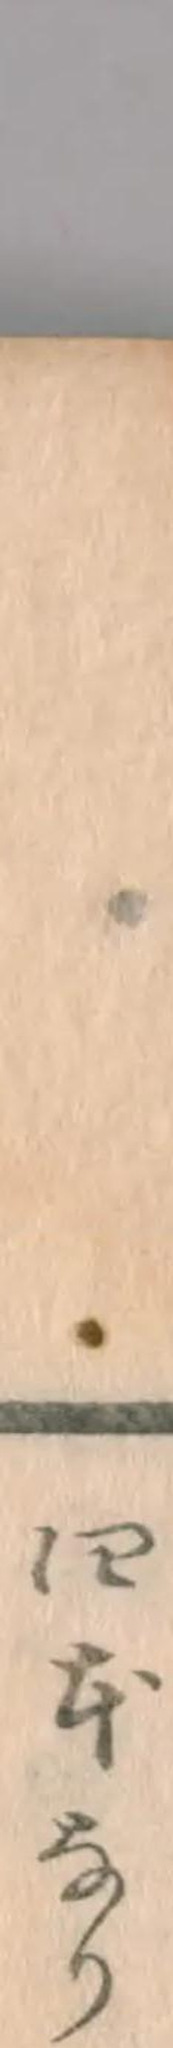四本なり
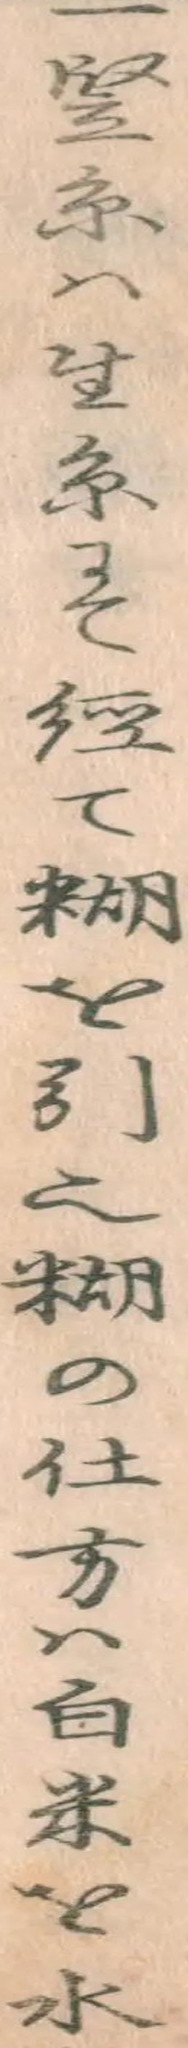一竪糸は生糸にて経て糊を引也糊の仕方は白米を水
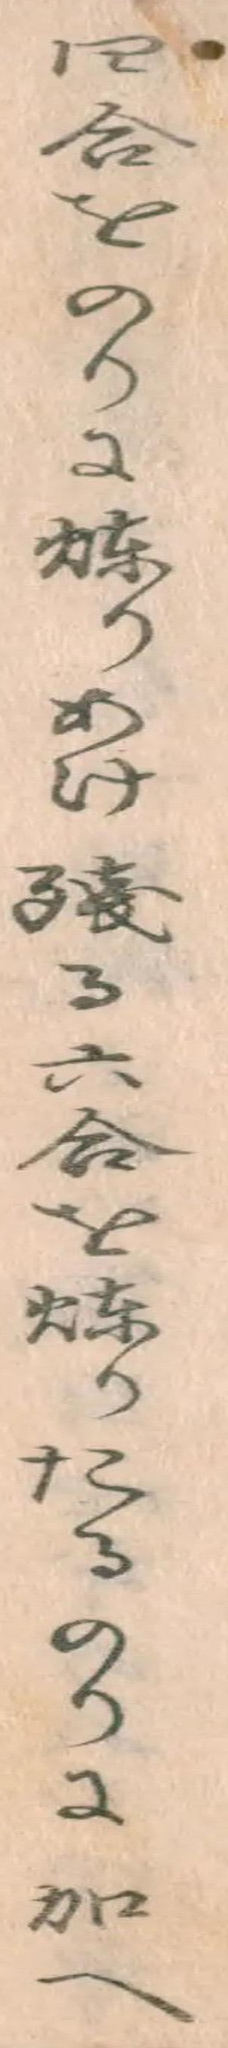四合をのりに煉りあけ残る六合を煉りたるのりに加へ
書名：機織彙編 5巻. [2]
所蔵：国立国会図書館 National Diet Library, JAPAN
